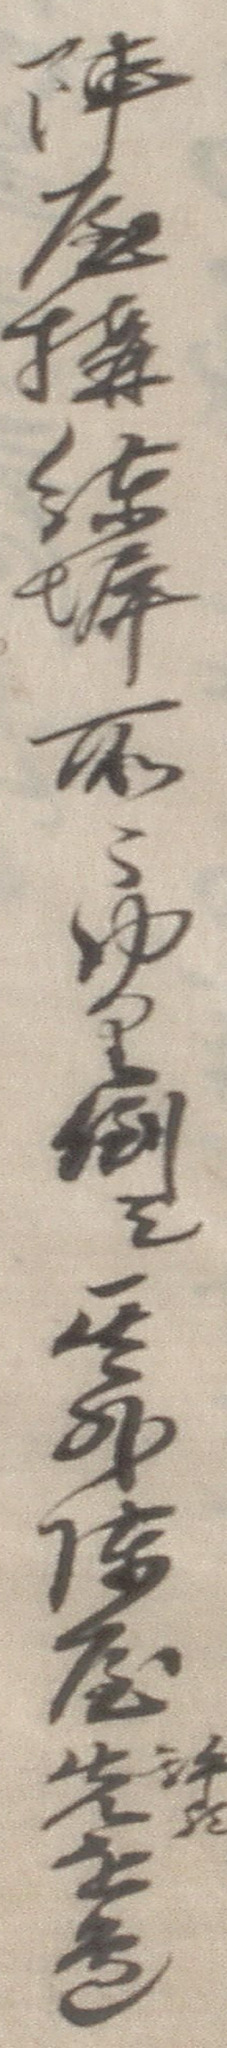陣屋構練塀所々ゆり倒ㇱ其外陣屋先近辺
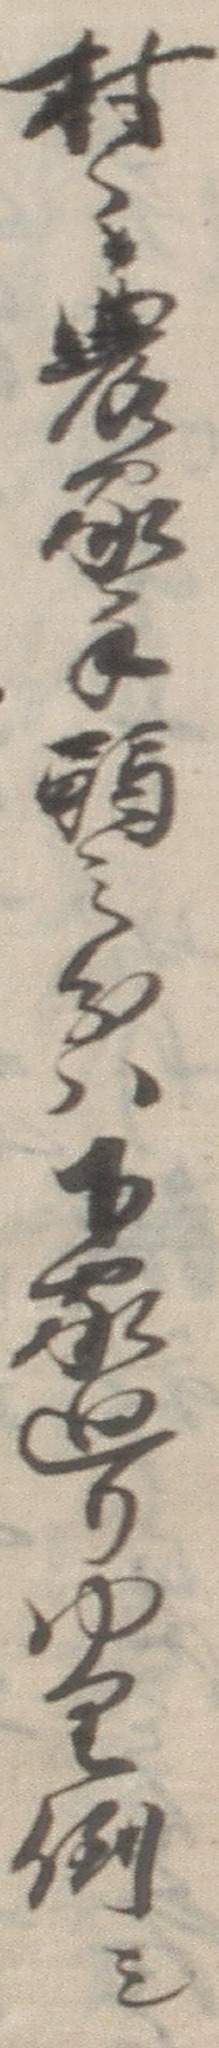村々農家手弱之分ハ下家廻りゆり倒ㇱ
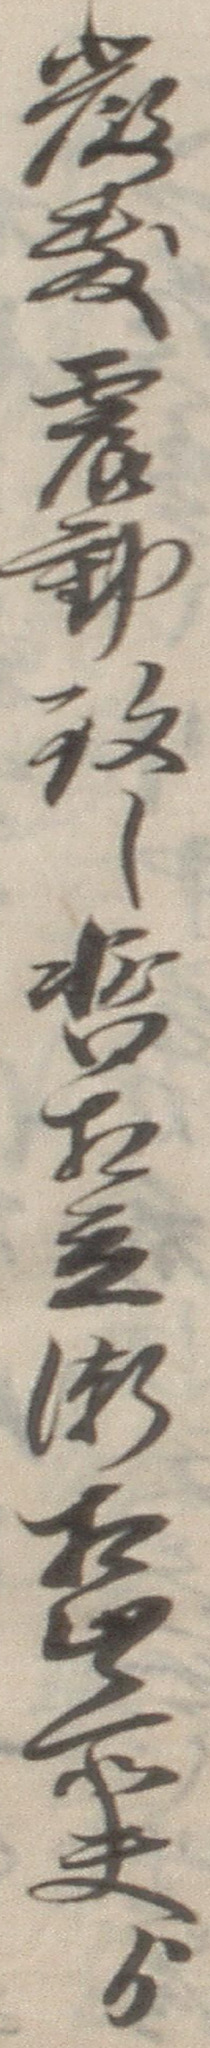厳敷震動致し暫相立漸相止候所夫ゟ
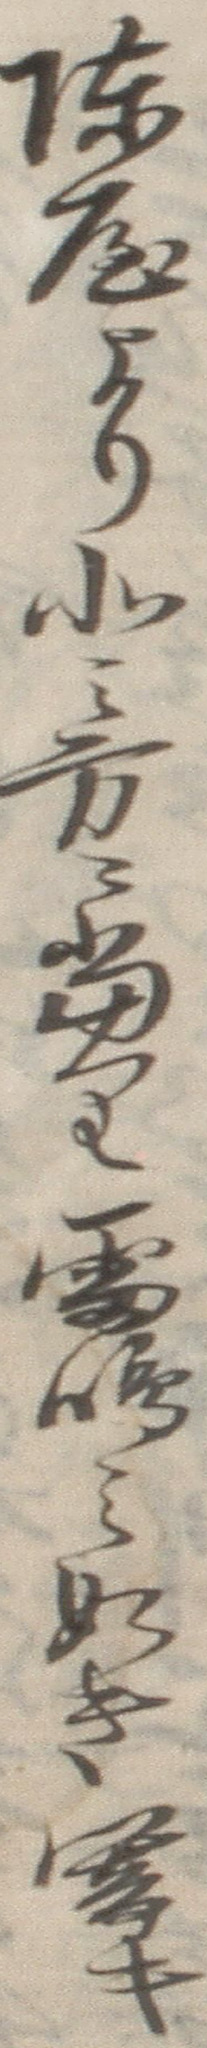陣屋より北之方二当り雷鳴之如き響キ
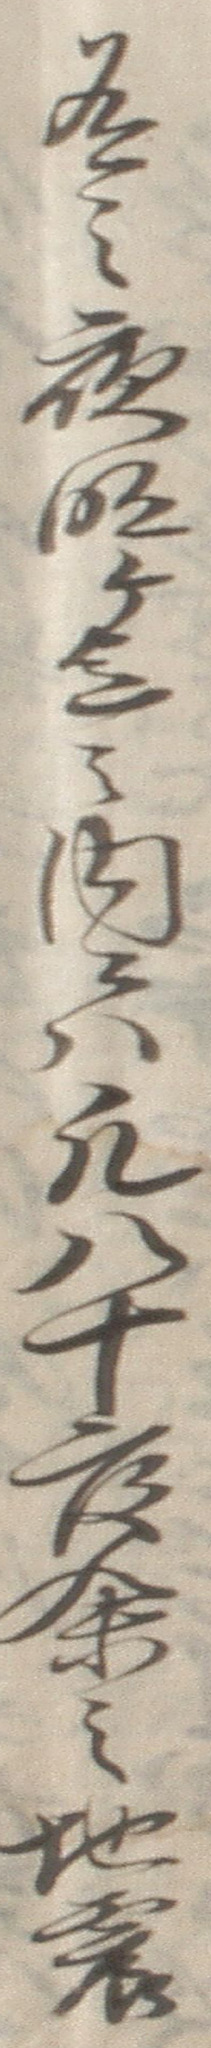有之夜明ヶ迄之内二ハ凡八十度余之地震
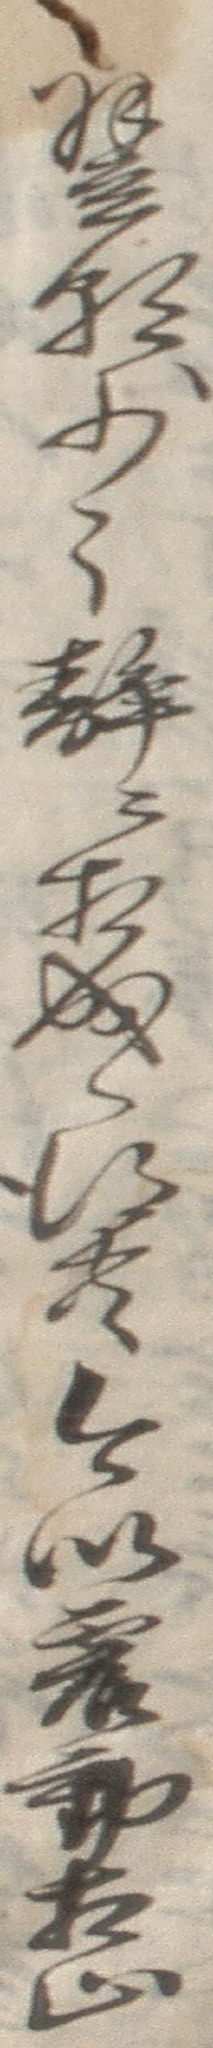翌朝少々静二相成候得共今以震動相止
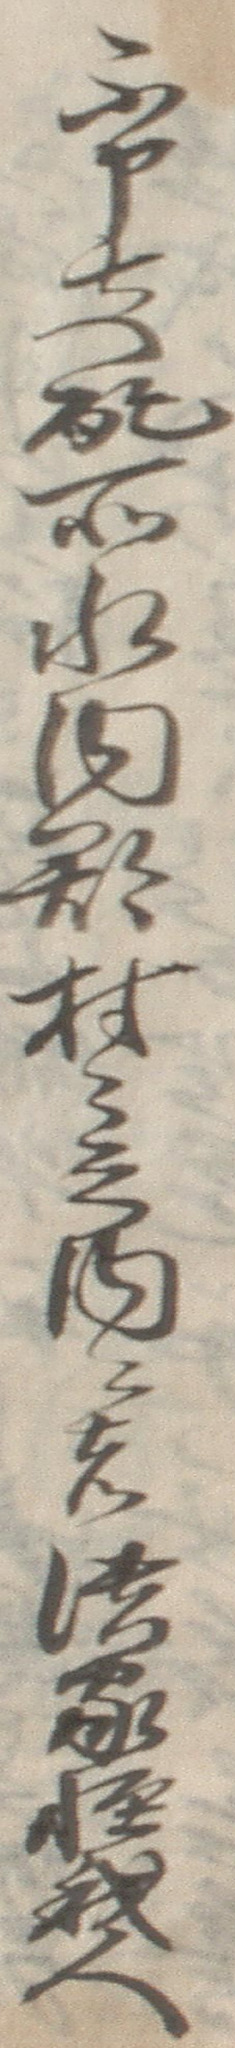不申支配所水内郡村々之内二は潰家怪我人
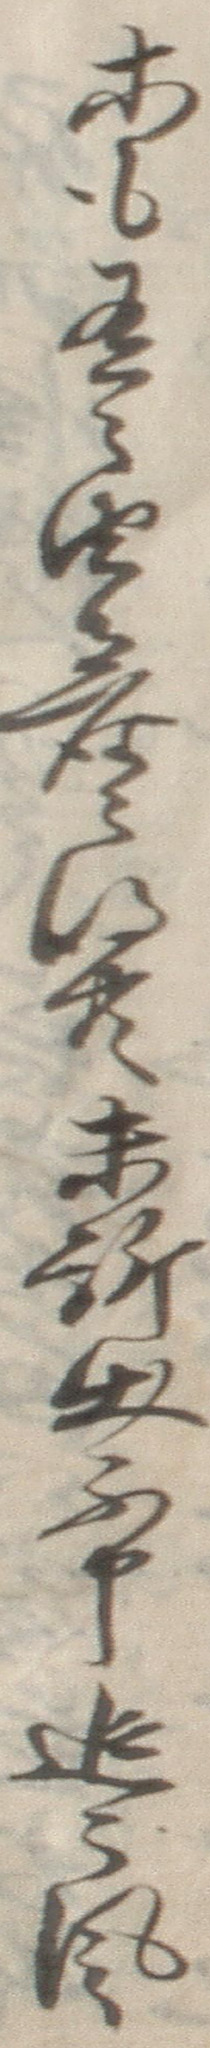等も有之由御座候得共未訴出不申追々風
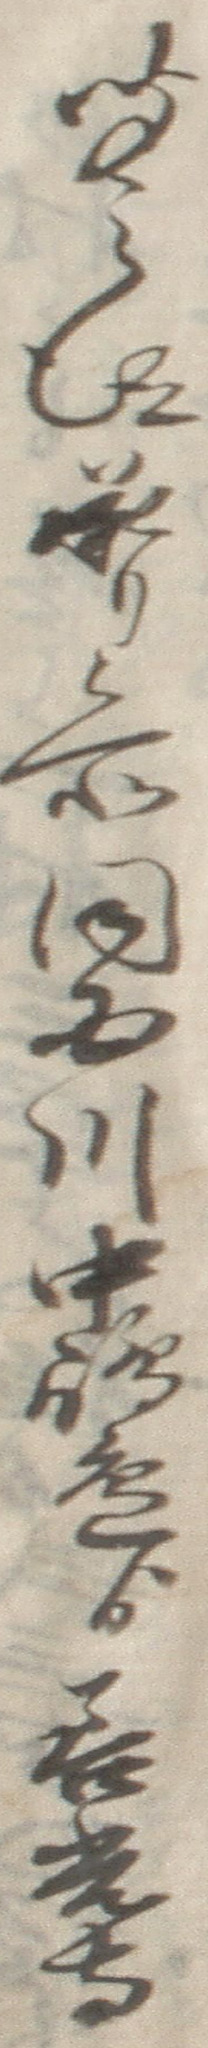聞之趣承候所同国川中島辺ゟ善光寺
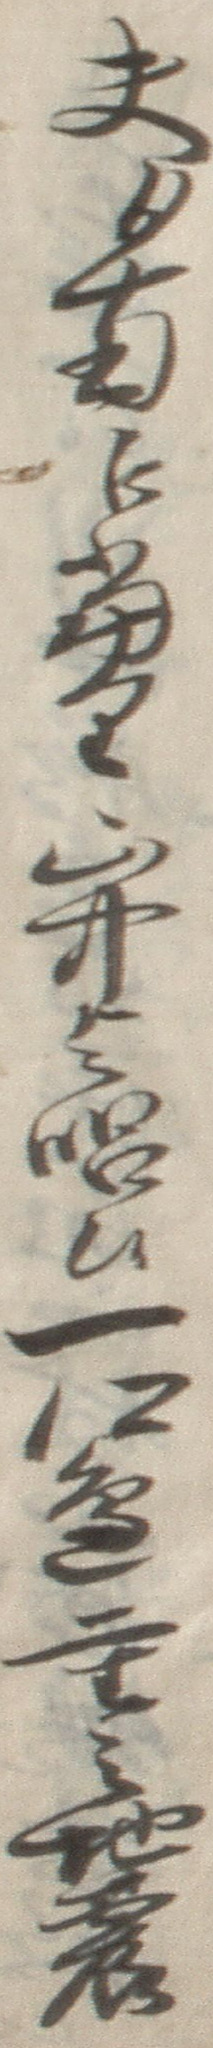夫ゟ南江当り山中と唱候一郷辺重之地震

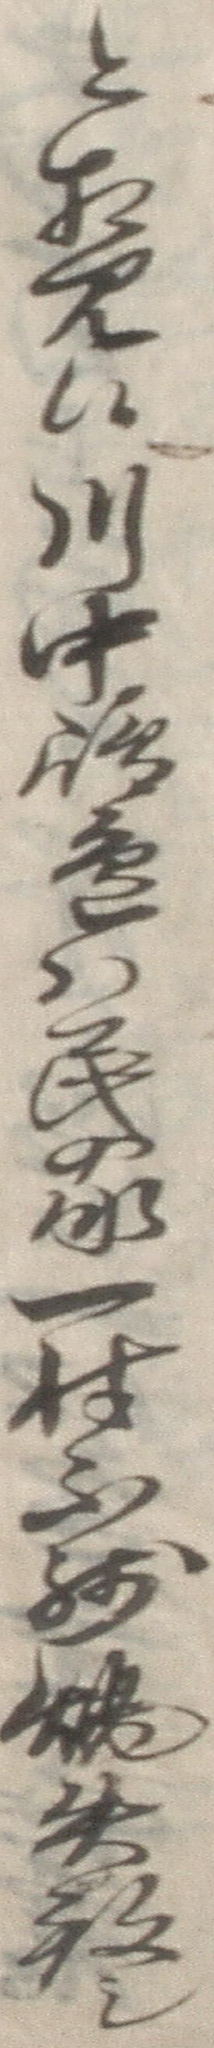と相見候川中嶋辺ハ民家一村不残焼失致し
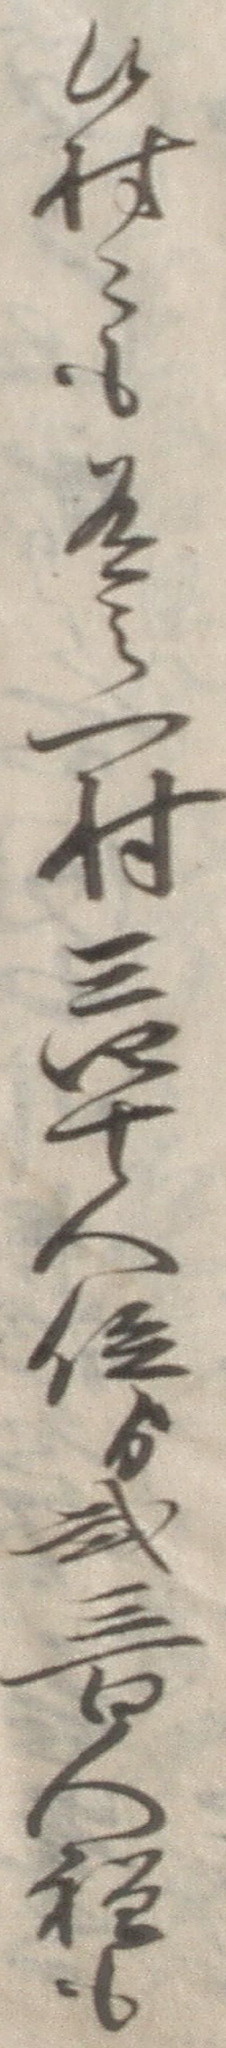候村々も有之一村三四十人位ゟ弐三百人程も
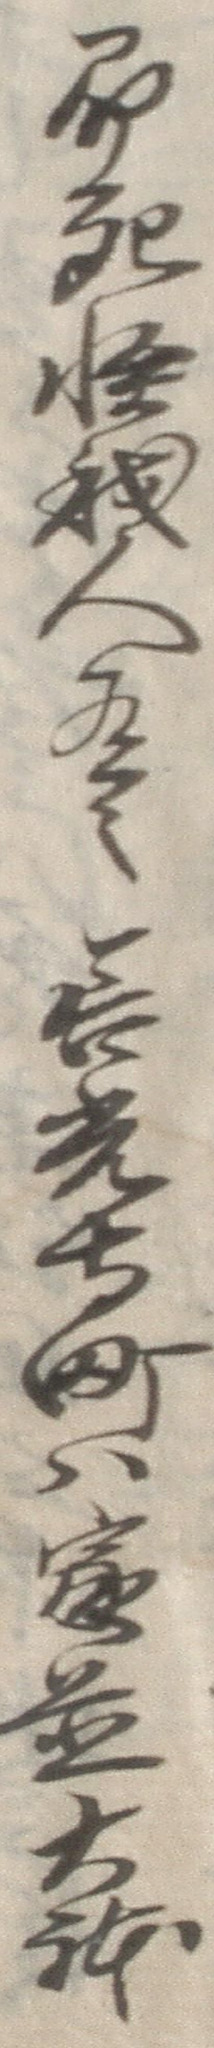即死怪我人有之善光寺町ハ家並大体
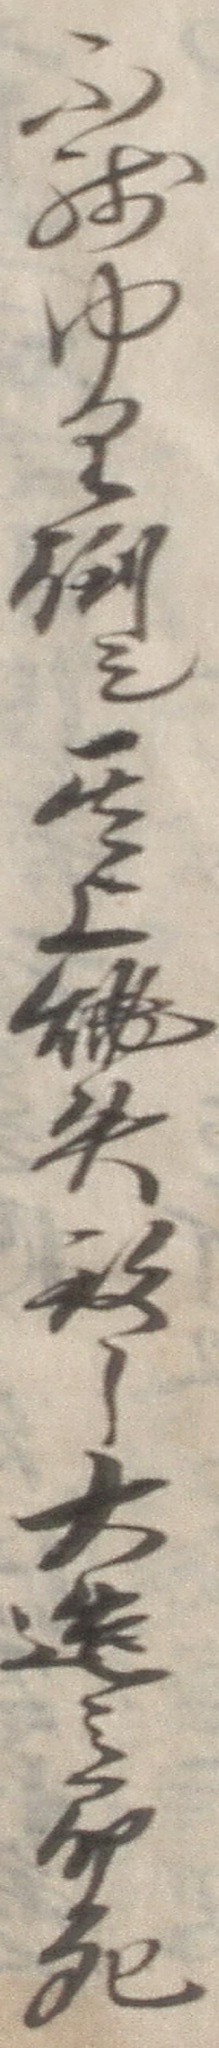不残ゆり倒ㇱ其上焼失致し大造之即死
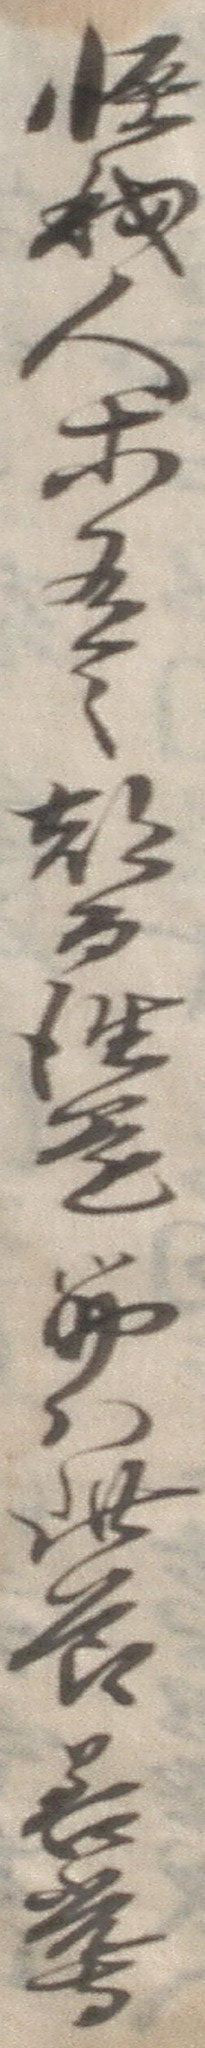怪我人等有之都而往還筋ハ此節善光寺
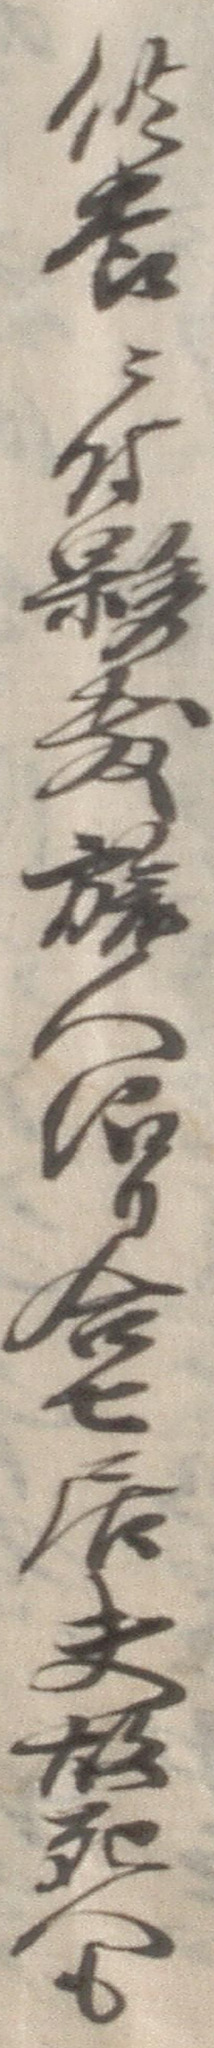供養ニ付夥敷旅人泊り合セ居夫故死人も
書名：信州地震一件
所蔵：東京大学地震研究所図書室 Earthquake Research Institute Library, The University of Tokyo, JAPAN
